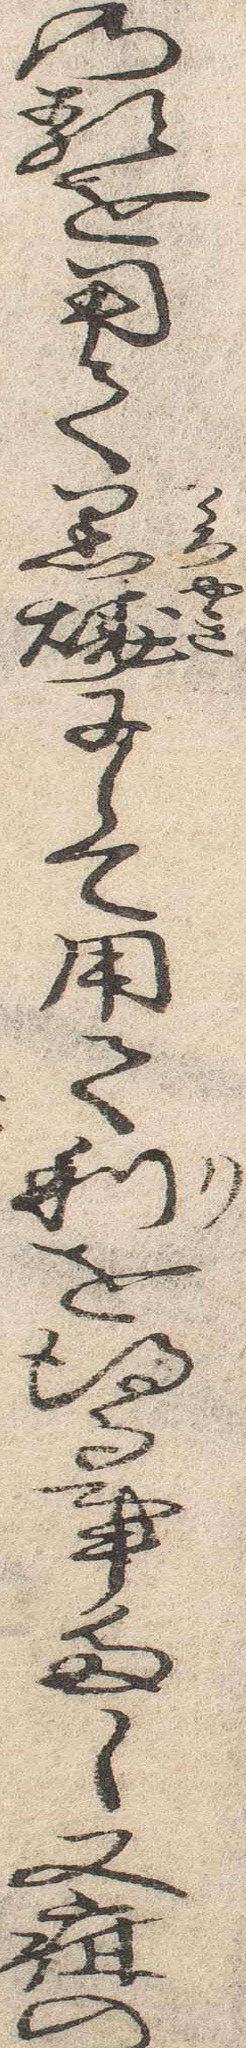の類を用て黒焼にして用て利を得る事多し又疳の
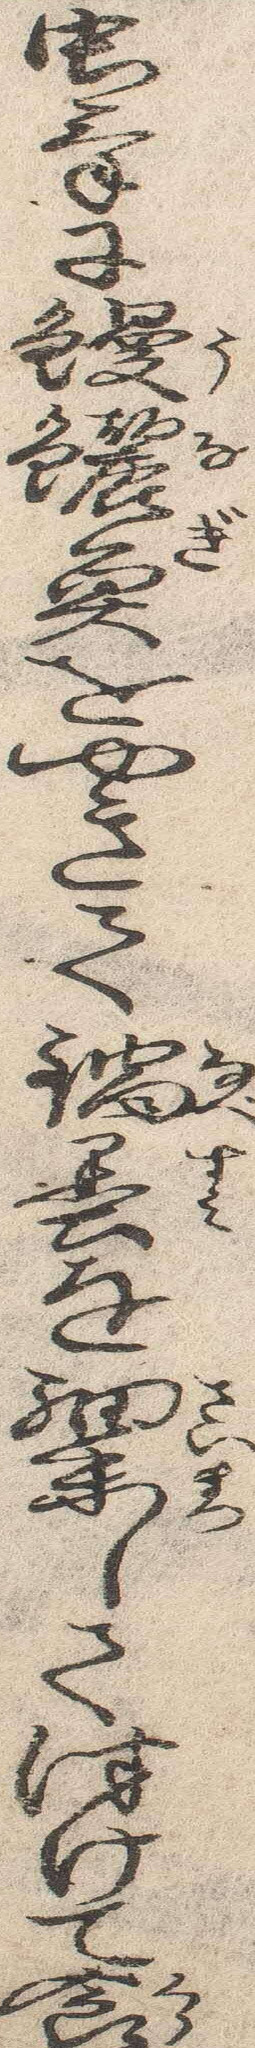虫気に鰻鱺魚をやきて鍋墨を細末してつけて食
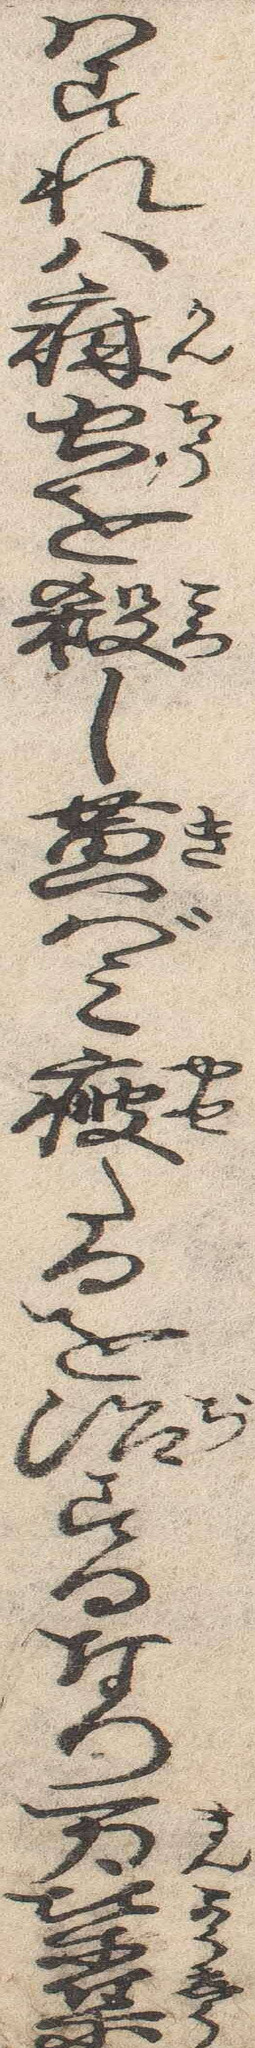はすれは疳虫を殺し黄ばみ痩たるを治するなり万葉集
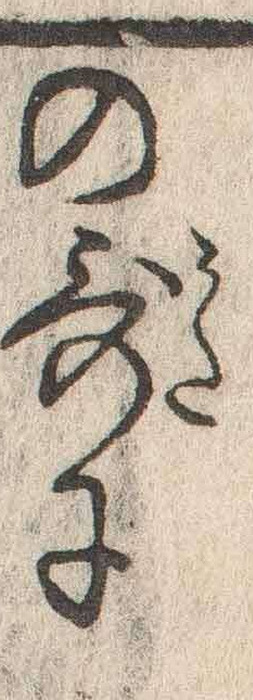の哥に
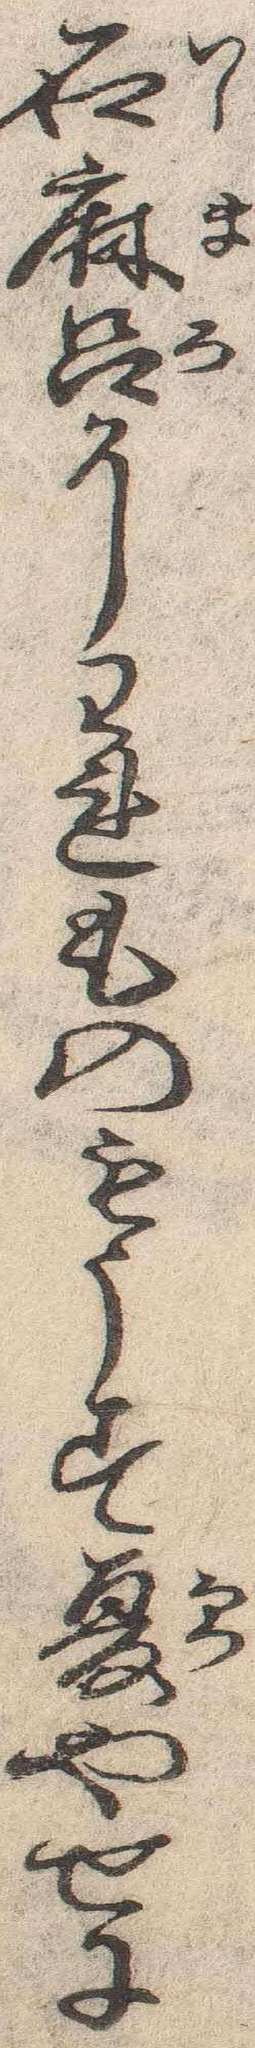石麻呂にわれものもうす夏やせに
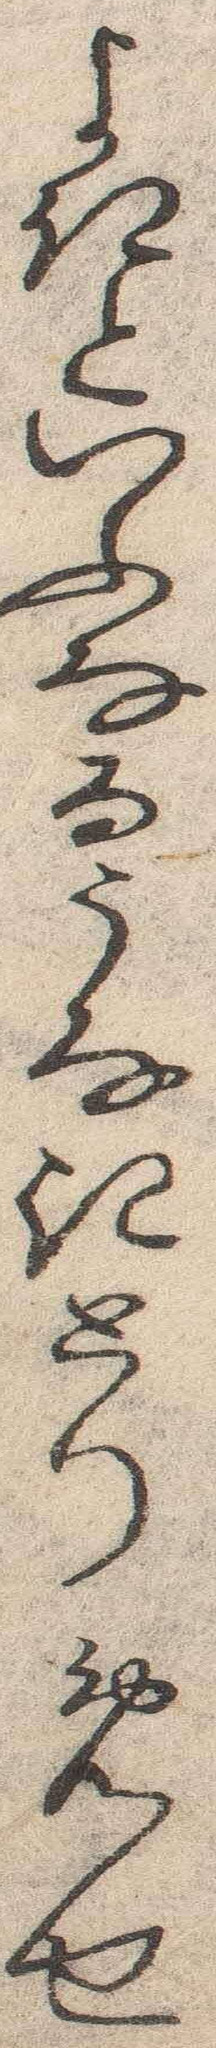よきといふなるうなきとりめせ
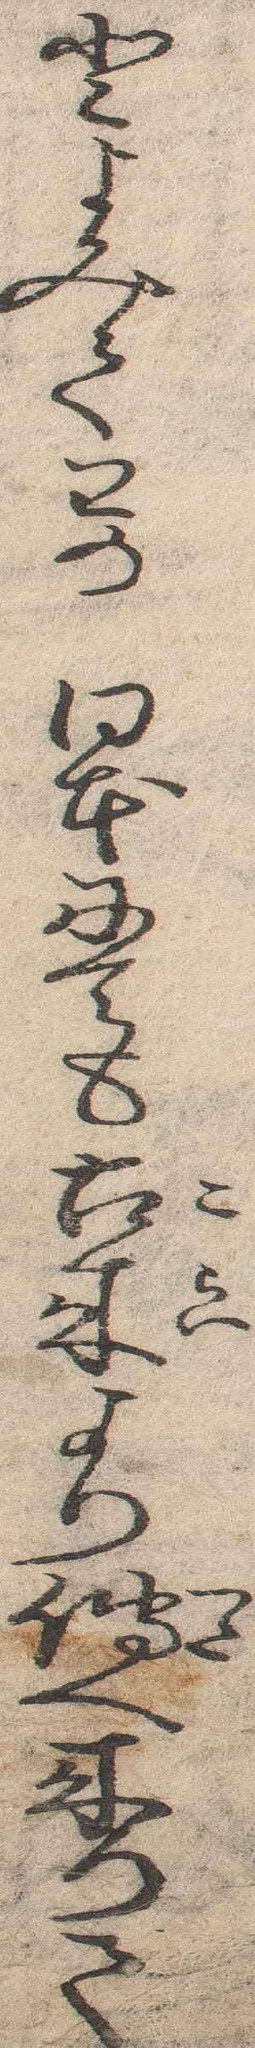とよみてわか日本にても古来より伝へ来りて

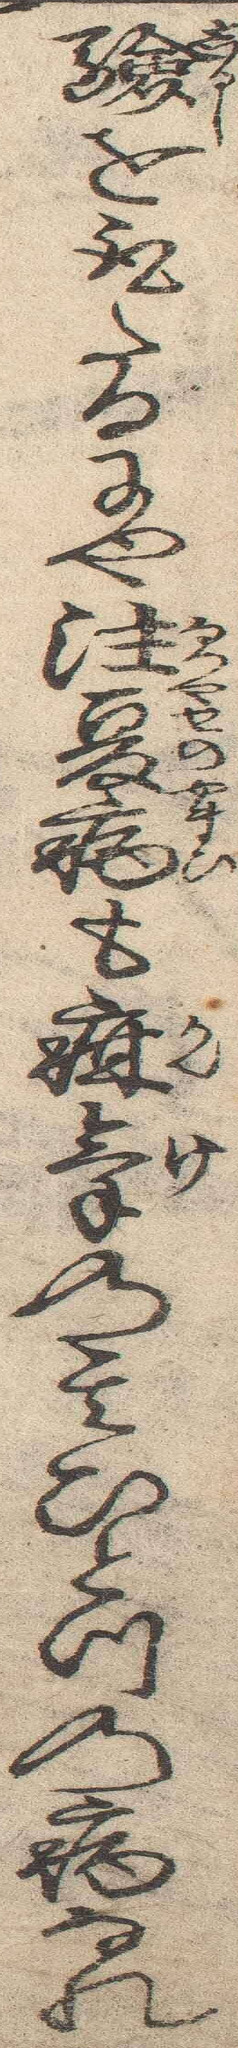験を取たるにや注夏病も疳気の其ひとつの病なれ
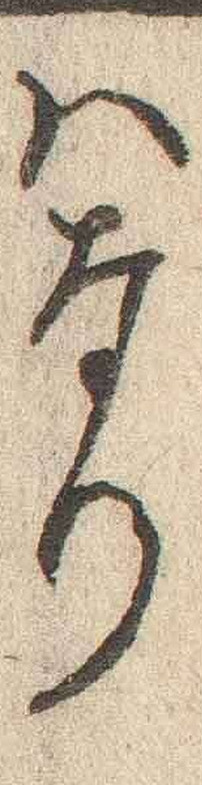はなり
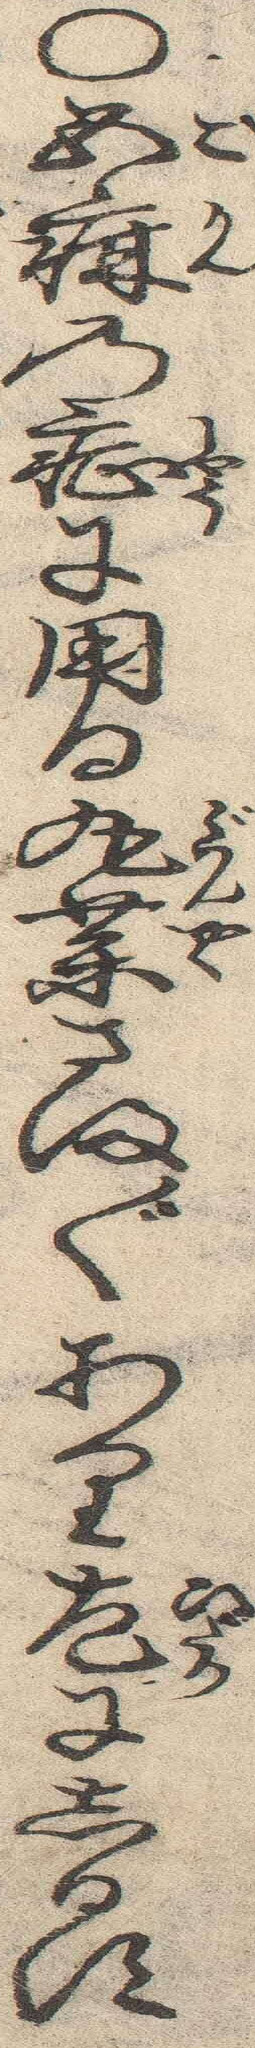○五疳の症に用る丸薬さま〴〵あり左にしるす
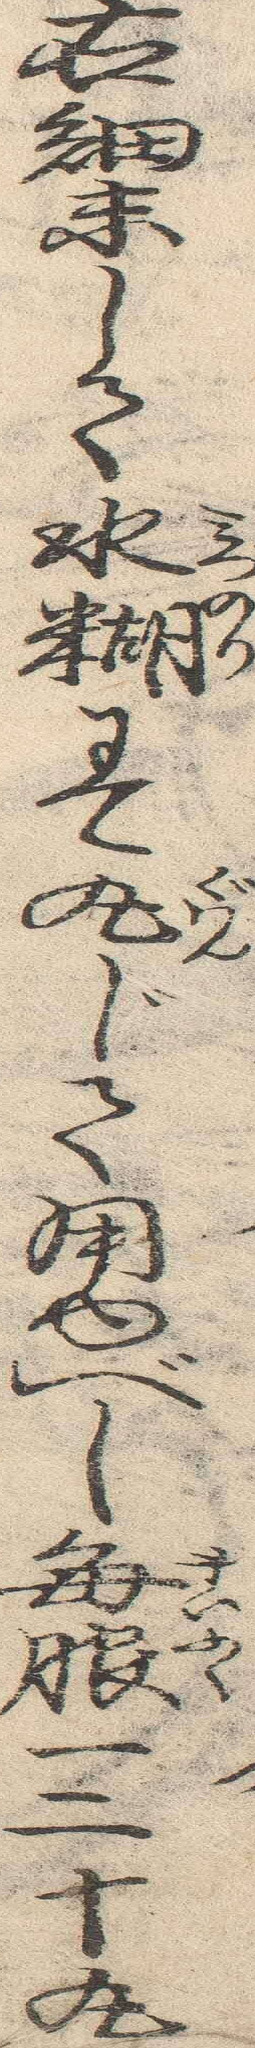右細末して水糊にて丸じて用ゆべし毎服一二十丸
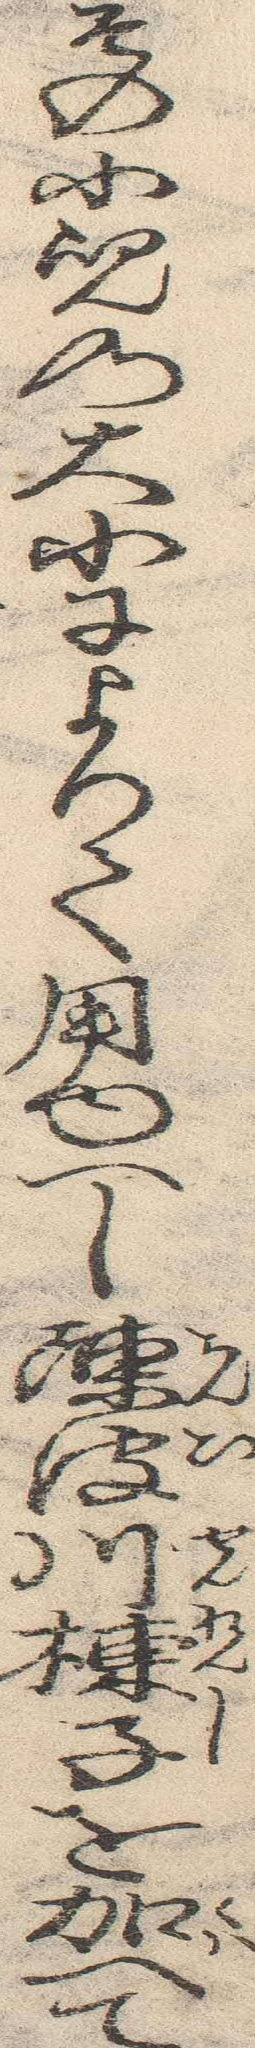その小児の大小によりて用ゆへし陳皮川楝子を加へて
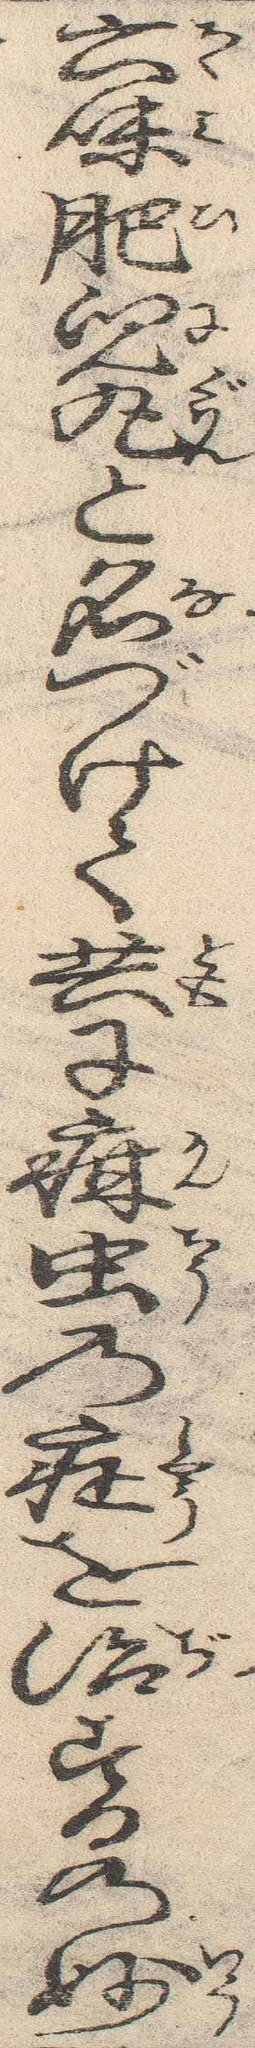六味肥児丸と名づけて共に疳虫の症を治するの妙
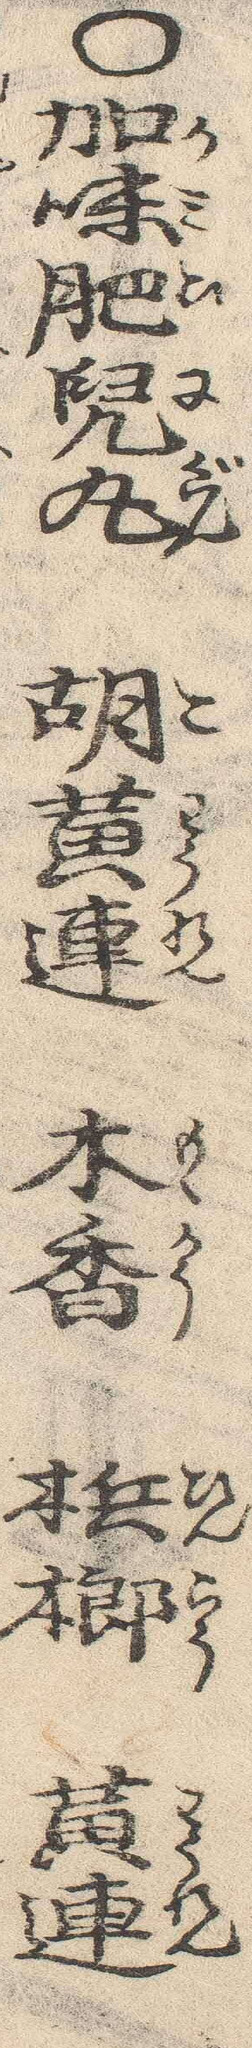○加味肥児丸胡黄連木香檳榔黄連
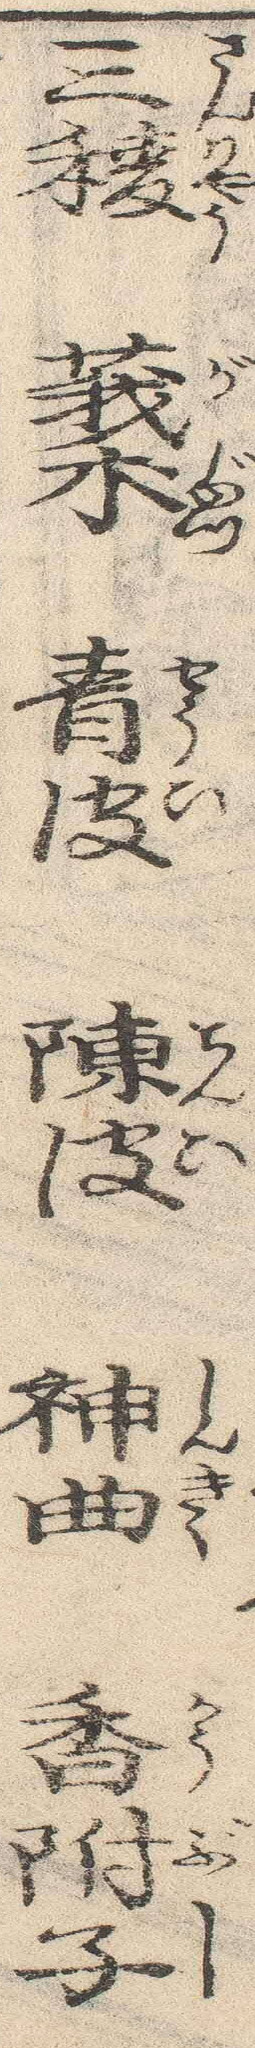山稜莪朮青皮陳皮神曲香附子
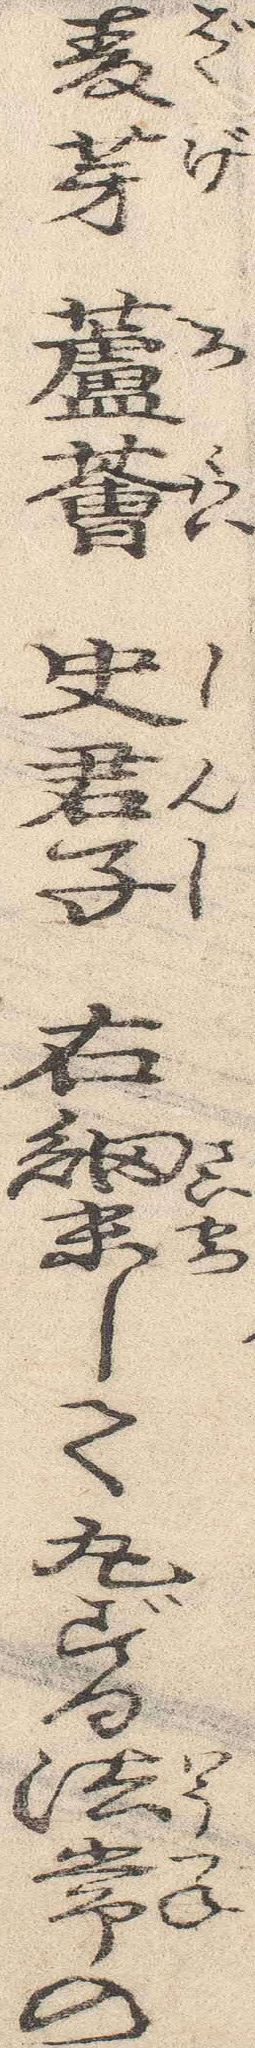麦芽蘆薈史君子右細末して丸ずる法常の
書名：小児必用養育草
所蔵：東京学芸大学附属図書館 国文学研究資料館
